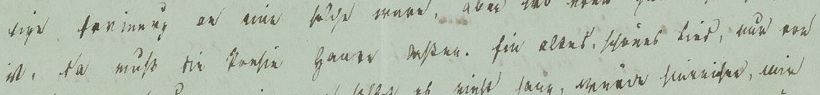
ist, da muß die Poesie Haare laßen. Ein altes, schönes Lied, nur von
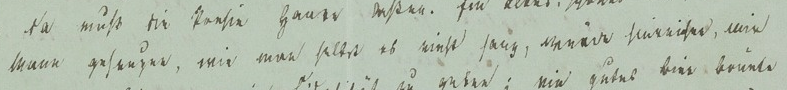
Mann gesungen, wie man selbst es einst sang, würde hinreichen, mir
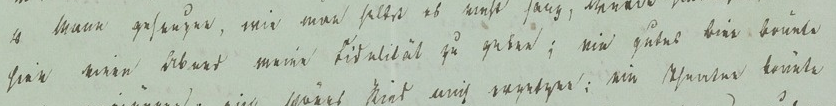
hier einen Abend meine Fidelität zu geben; ein gutes Bier könnte
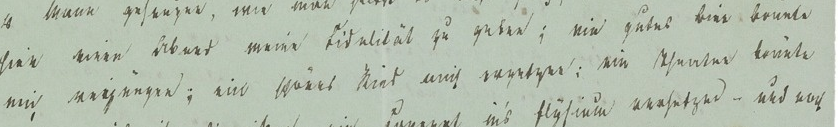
mich vergnügen; ein schönes Kind mich ergetzen; ein Theater könnte
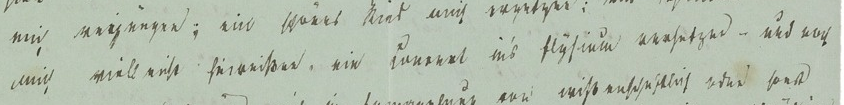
mich vielleicht hinreißen, ein Concert in's Elysium versetzen – und noch
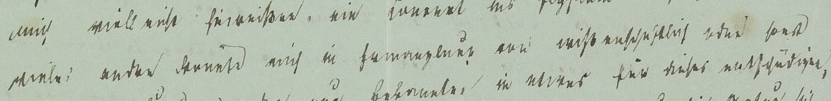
vieles andre könnte mich in Ermanglung von wißenschaftlich oder sonst
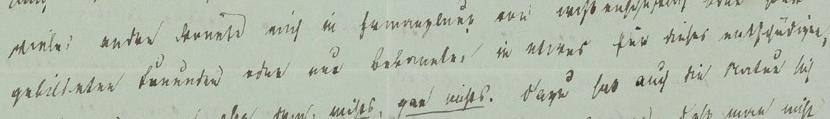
gebildeten Freunden oder nur Bekannten in etwas für dieses entschädigen,
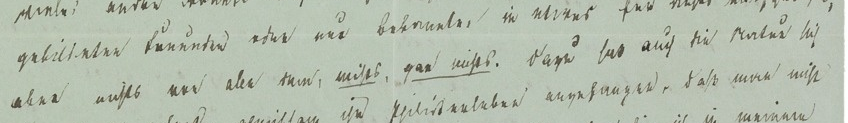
aber nichts von alle dem, nichts, gar nichts. Dazu hat auch die Natur sich
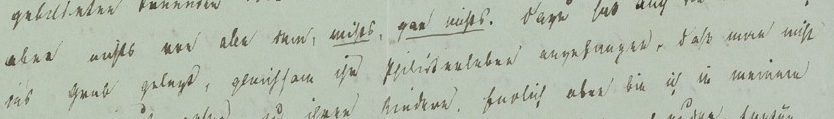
in's Grab gelegt, gleichsam ihr Philisterleben angefangen, daß man nicht
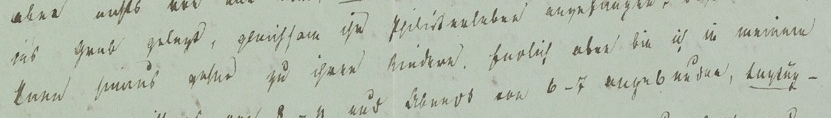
kann hinaus gehen zu ihren Kindern. Endlich aber bin ich in meinem
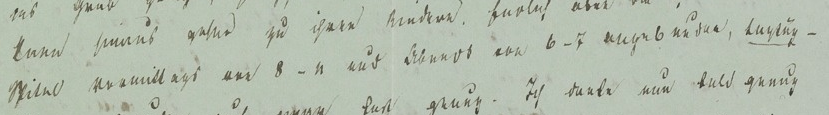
Spital vormittags von 8–11 und Abends von 6–7 angebunden, tagtäg-
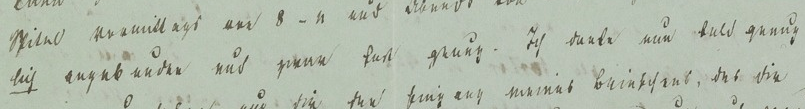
lich angebunden und zwar fest genug. Ich denke nun bald genug
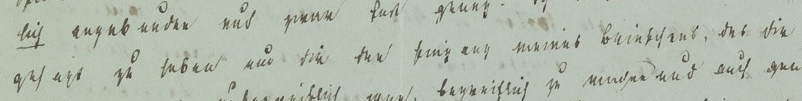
gesagt zu haben um dir den Eingang meines Briefchens, der dir
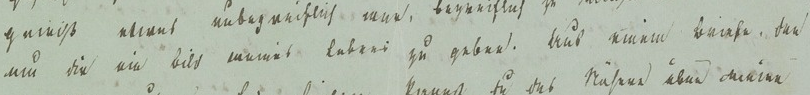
um dir ein Bild meines Lebens zu geben. Aus einem Briefe, den
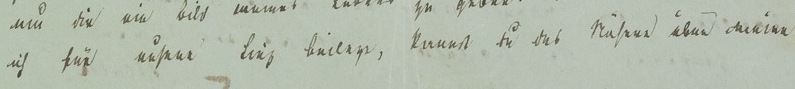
ich für unsren Sinz beilege, kannst du das Nähere über meine
